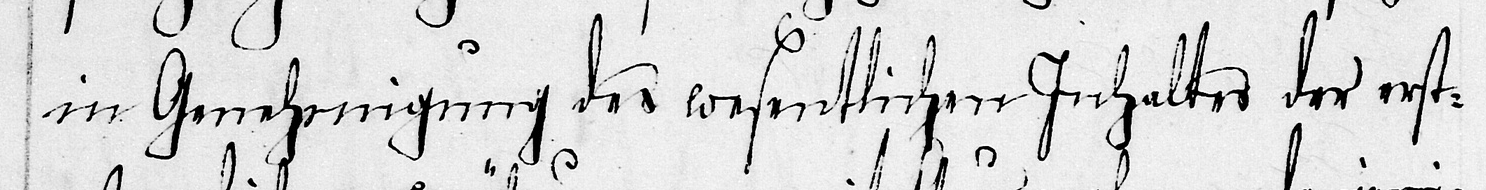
in Genehmigung des wesentlichen Inhaltes der erst¬
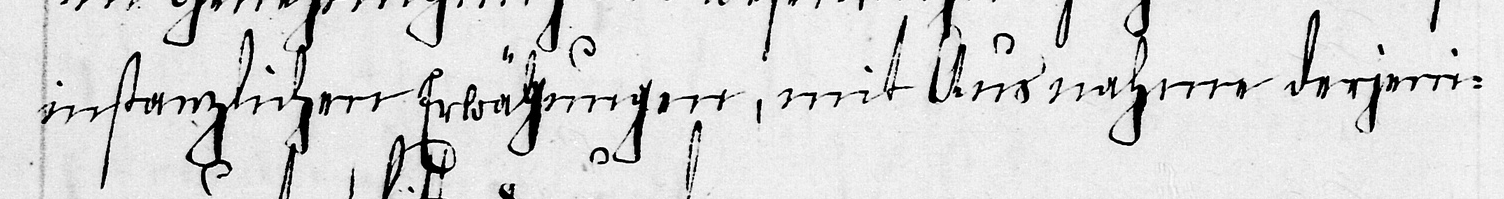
instanzlichen Erwähnungen, mit Ausnahme derjeni¬
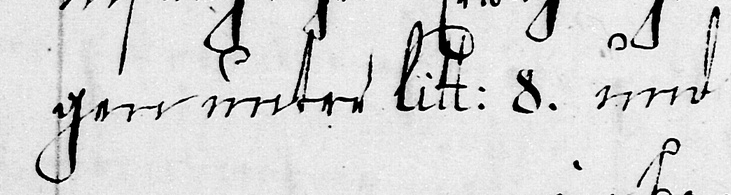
gen unter litt: 8. und
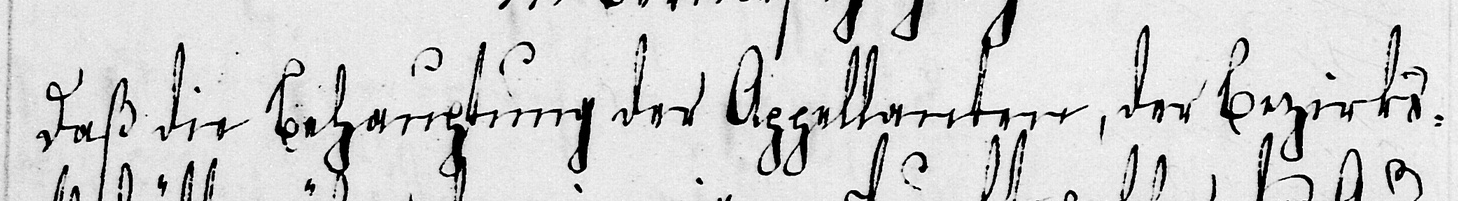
Daß die Behauptung der Appellanten, der Bezirks¬
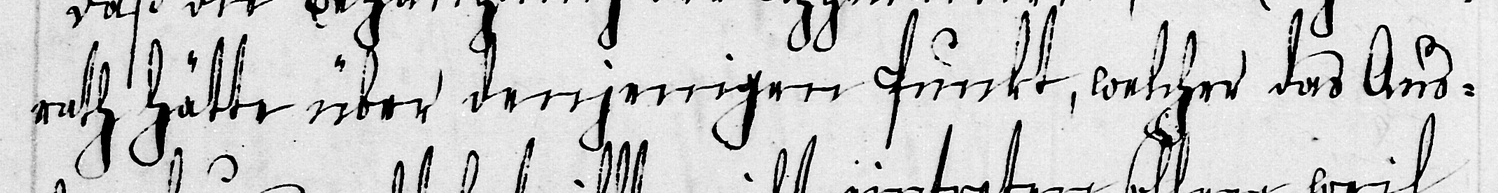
rath hätte über denjenigen Punkt, welcher das Aus¬
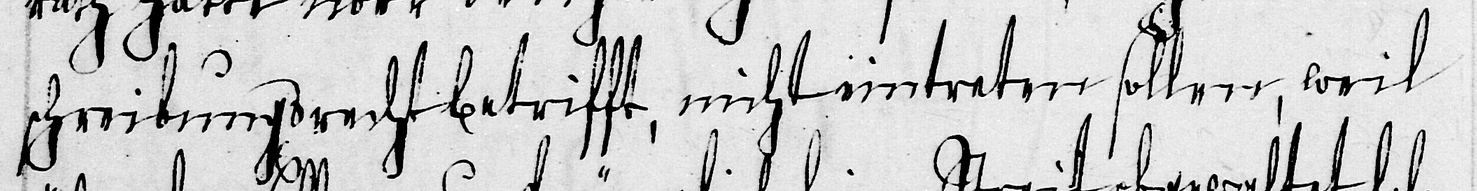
schreibungsrecht betrifft, nicht eintreten sollen, weil
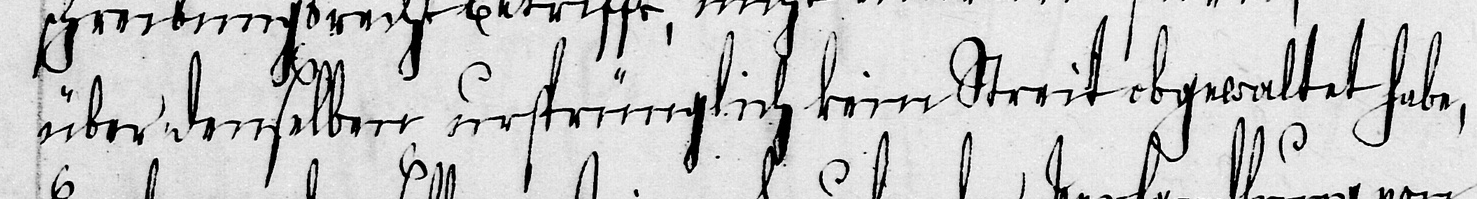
über denselben ursprünglich kein Streit obgewaltet hab¬
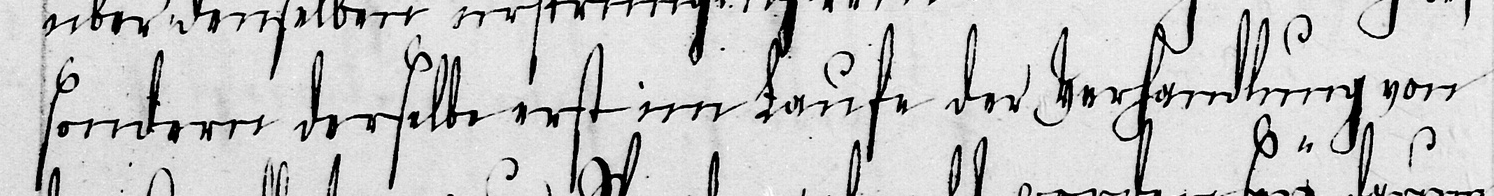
sondern derselbe erst im Laufe der Verhandlung von
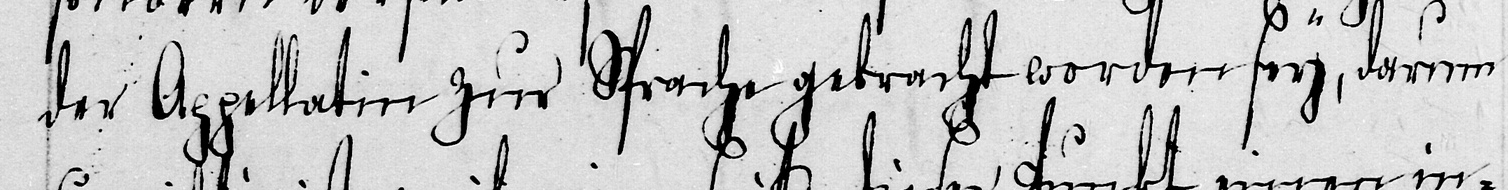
der Appellatin zur Sprache gebracht worden sey, darum
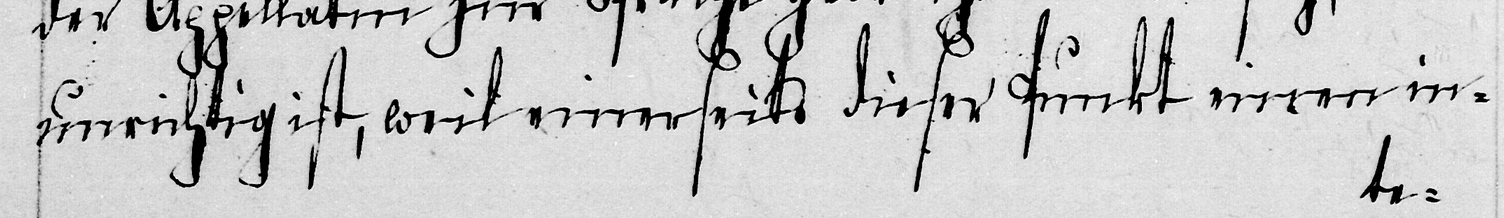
unrichtig ist, weil einerseits dieser Punkt einen in-
